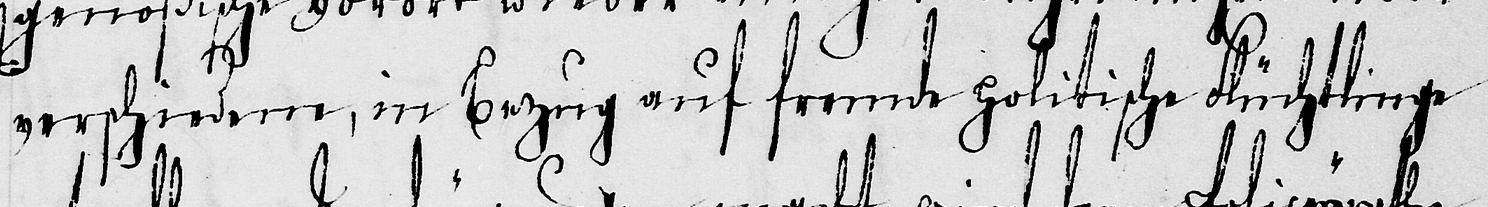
verschiedene, in Bezug auf fremde politische Flüchtlinge
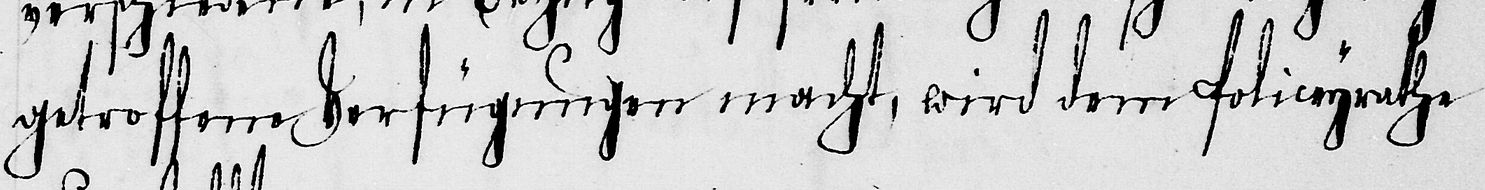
getroffene Verfügungen macht, wird dem Policeyrathe
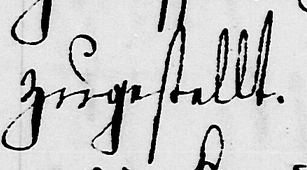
zugestellt.
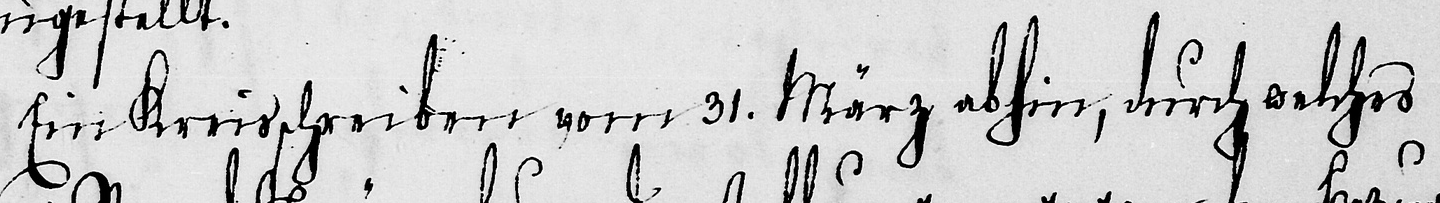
Ein Kreisschreiben vom 31. März abhin, durch welches
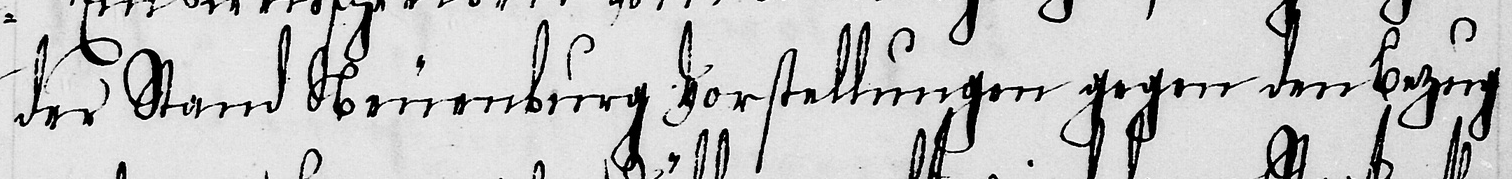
der Stand Neuenburg Vorstellungen gegen den Bezug
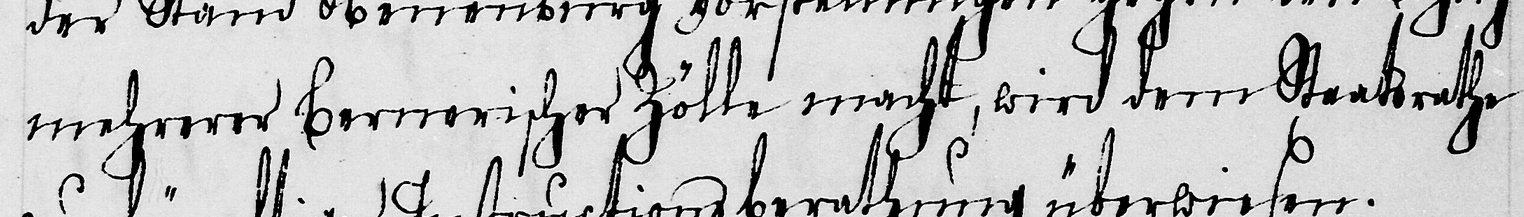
mehrerer Bernischer Zölle macht, wird dem Staatsrathe
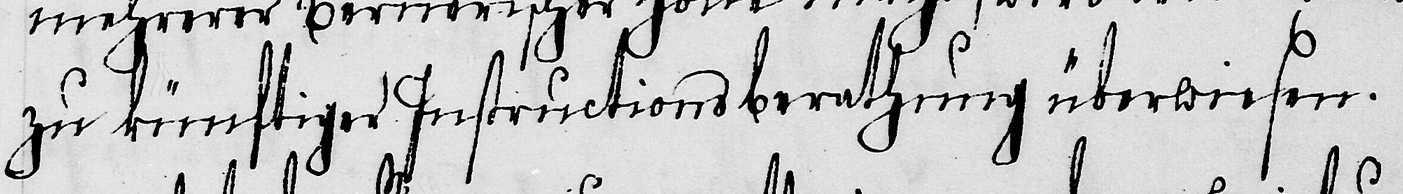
zu künftiger Instructionsberathung überwiesen.
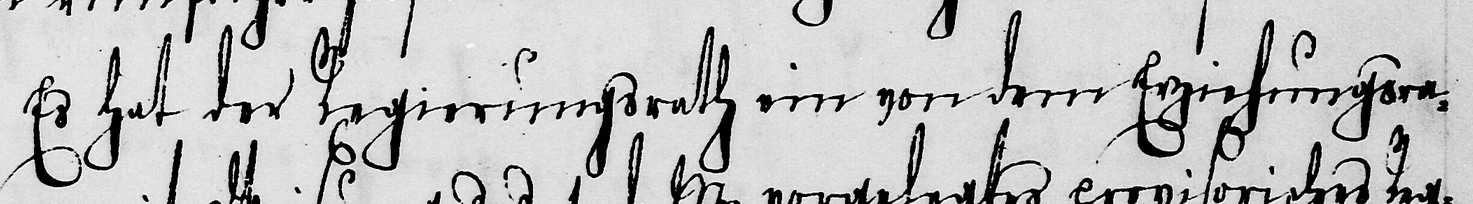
Es hat der Regierungsrath ein von dem Erziehungsra¬
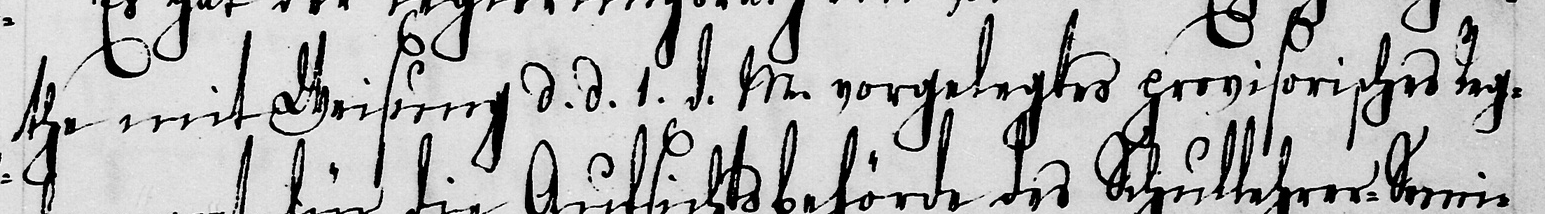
the mit Weisung d. d. 1. d. M. vorgelegtes provisorisches Reg¬
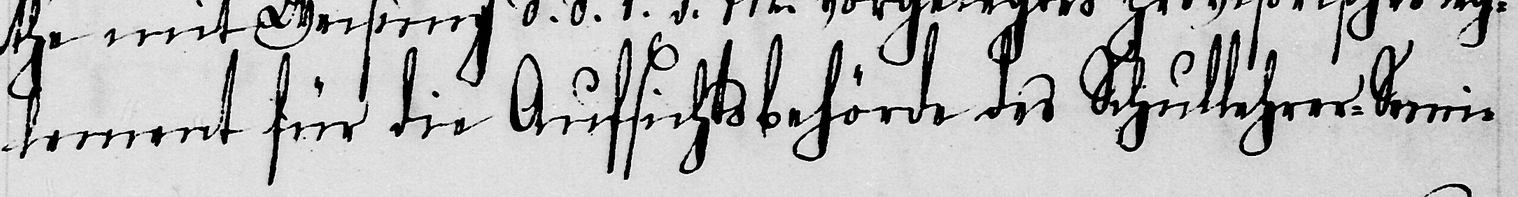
lement für die Aufsichtsbehörde des Schullehrer-Semi-
